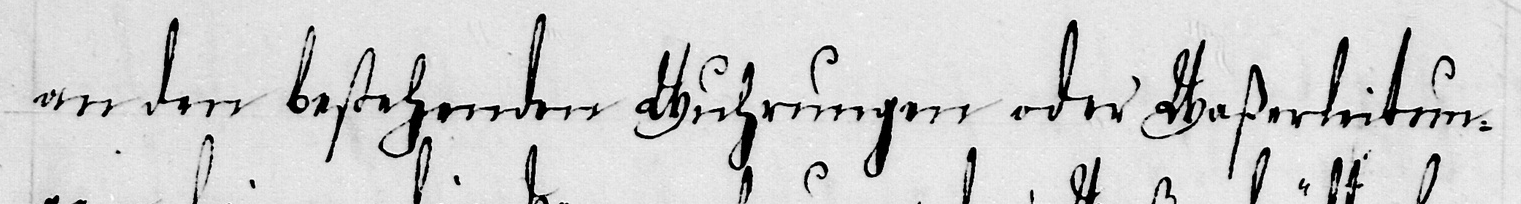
an den bestehenden Wuhrungen oder Waßerleitun¬
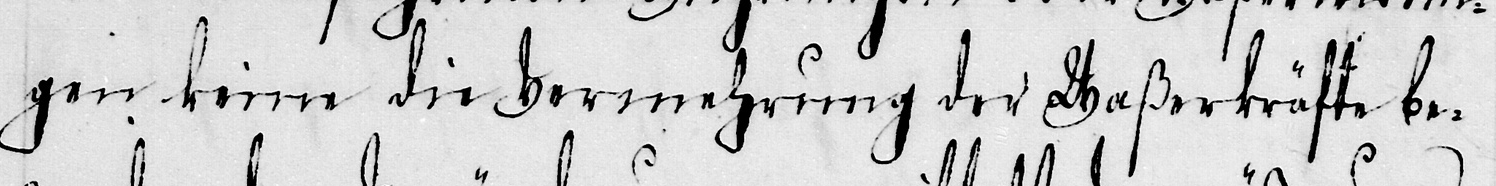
gen keine die Vermehrung der Waßerkräfte be¬
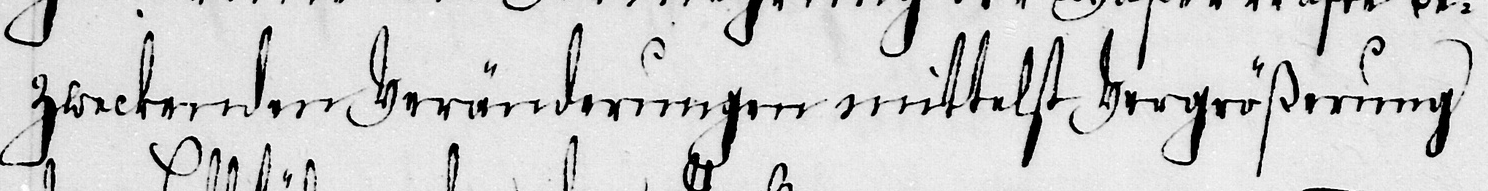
zweckenden Veränderungen mittelst Vergrößerung
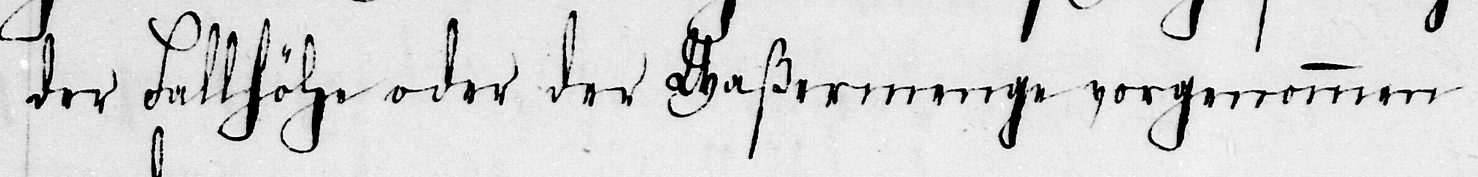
der Fallhöhe oder der Waßermenge vorgenommen
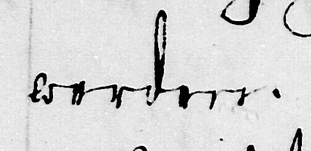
werden.
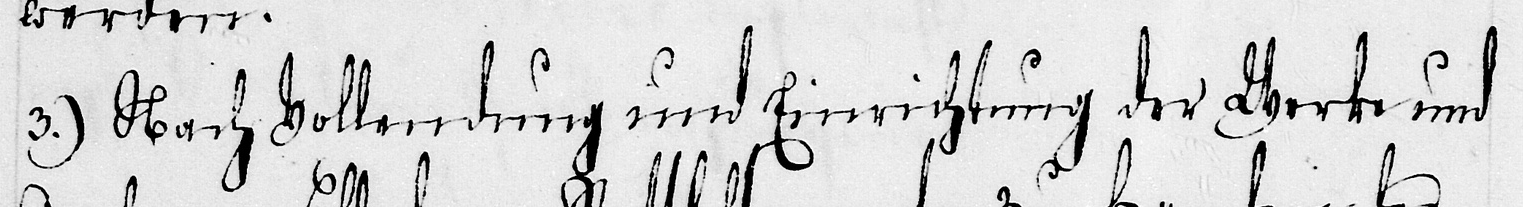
3.) Nach Vollendung und Einrichtung der Werke und
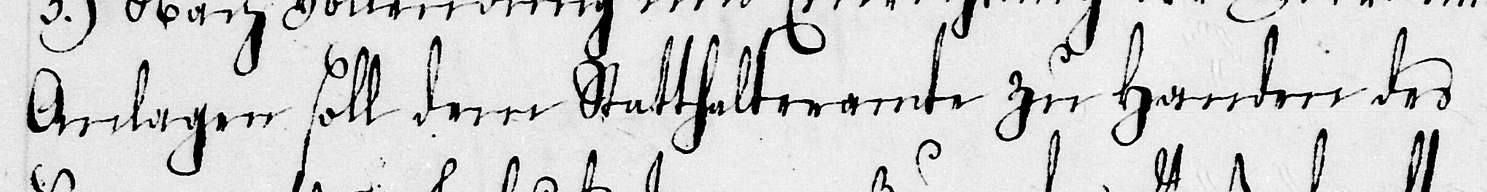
Anlagen soll dem Statthalteramte zu Handen des
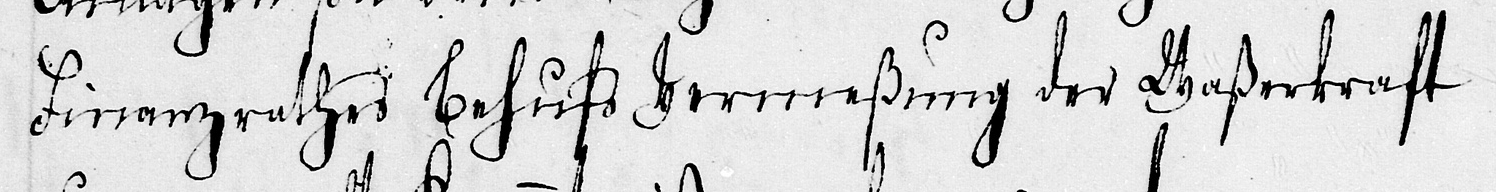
Finanzrathes behufs Vermeßung der Waßerkraft
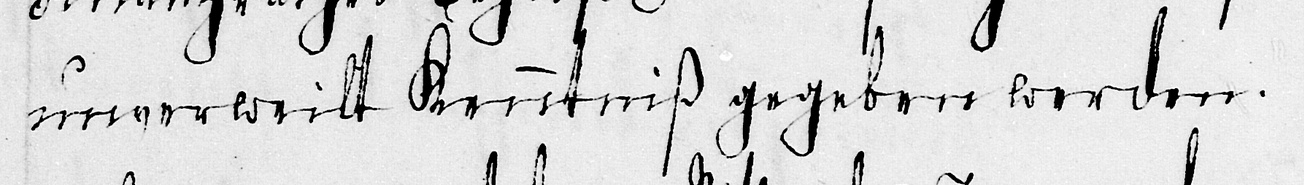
unverweilt Kenntniß gegeben werden.
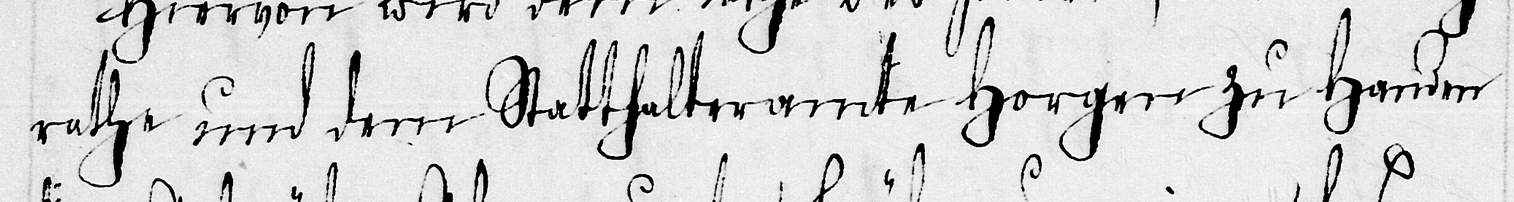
rathe und dem Statthalteramte Horgen zu Handen
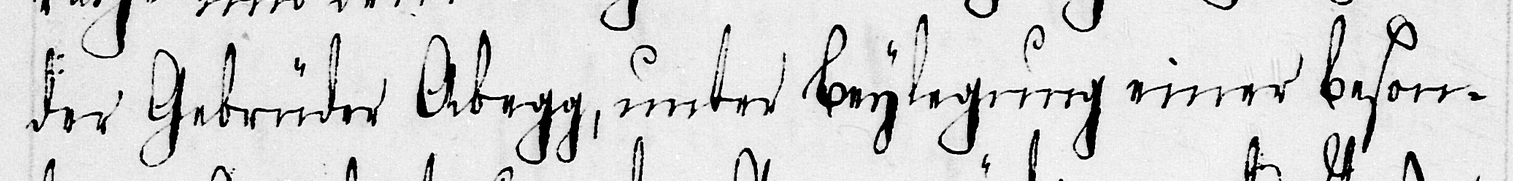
der Gebrüder Abegg, unter Beylegung einer beson¬
